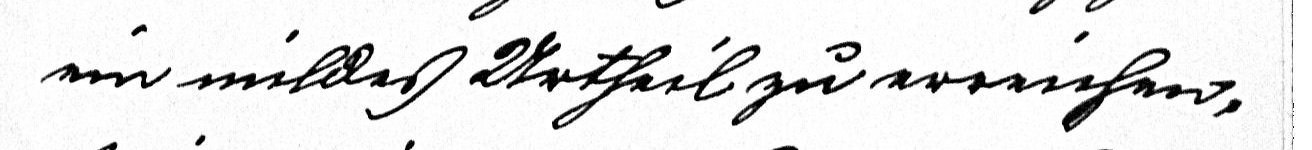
ein mildes Urtheil zu erreichen,
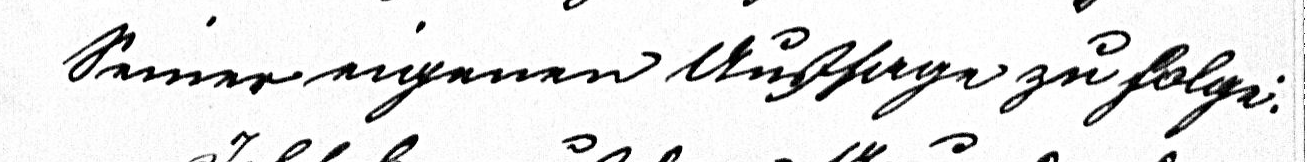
Seiner eigenen Aussage zu folge:
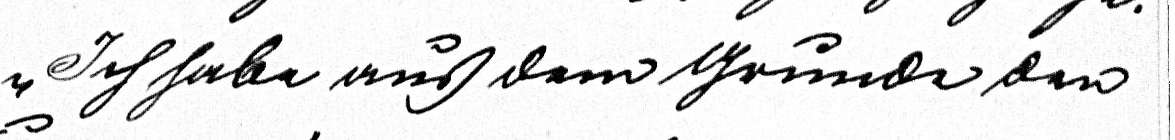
„Ich habe aus dem Grunde den
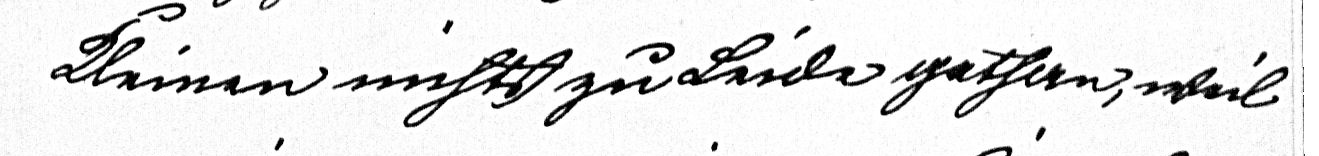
Kleinen nichts zu Leide gethan, weil
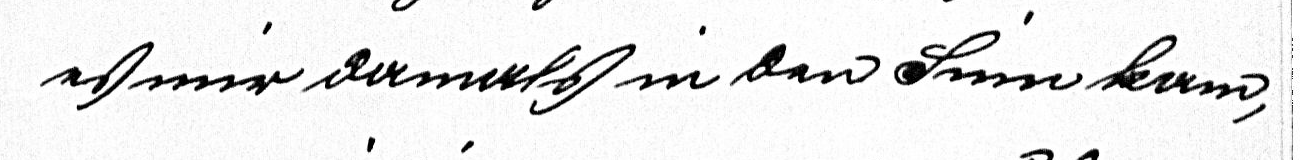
es mir damals in den Sinn kam,
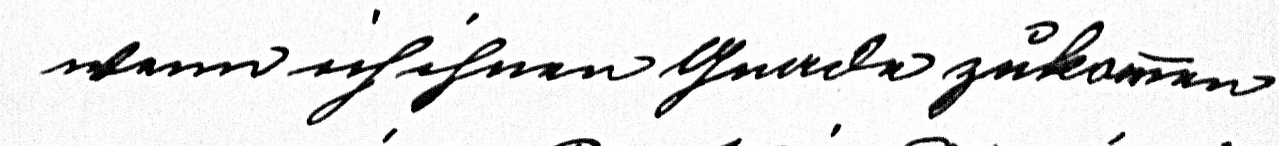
wenn ich ihnen Gnade zukommen
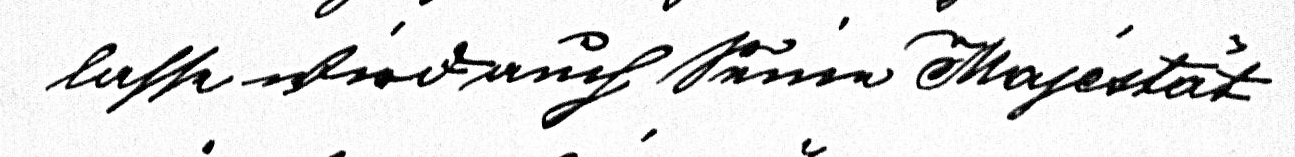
lasse wird auch Senie Majéstät
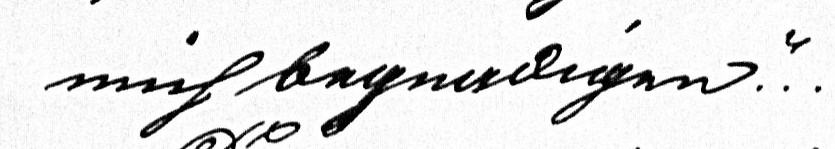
mich begnadigen“...
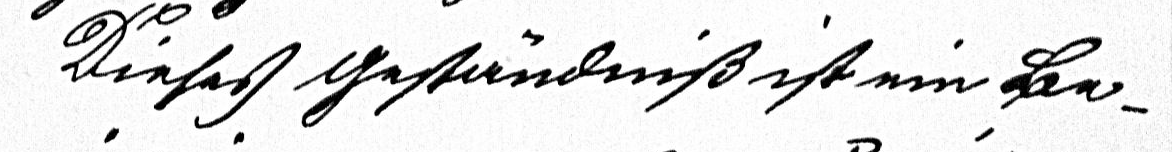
Dieses Geständniß ist ein Be¬
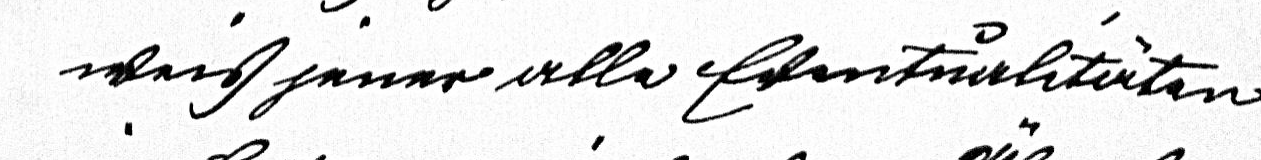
weis jener alle Eventualitäten
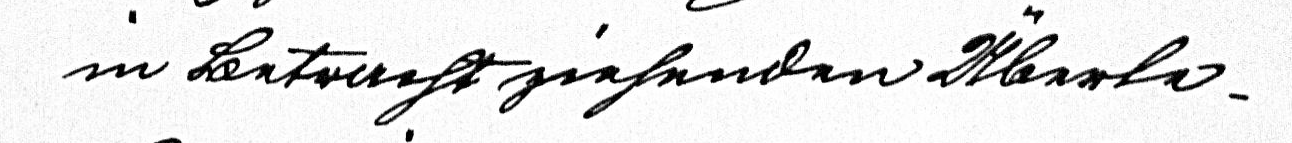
in Betracht ziehenden Überle¬
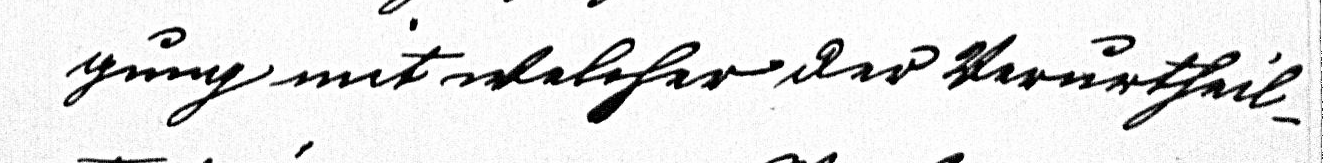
gung mit welcher der Verurtheil¬
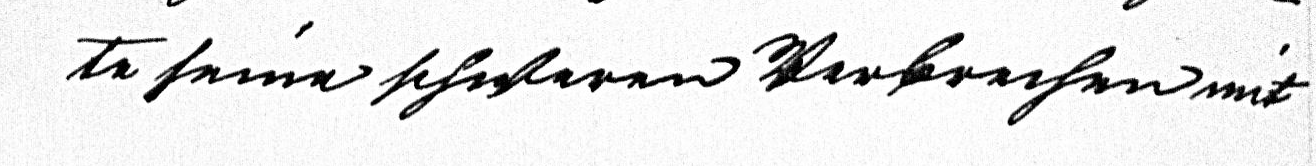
te seine schweren Verbrechen mit
